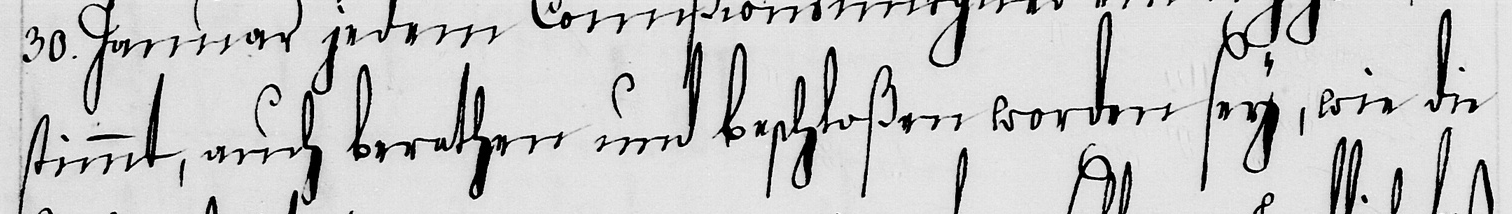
timmt, auch berathen und beschloßen worden sey, wie die
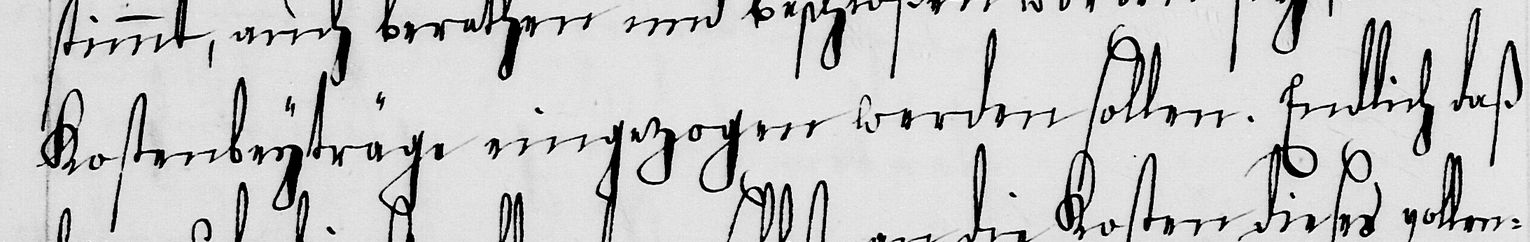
Kostenbeyträge eingezogen werden sollen. Endlich daß
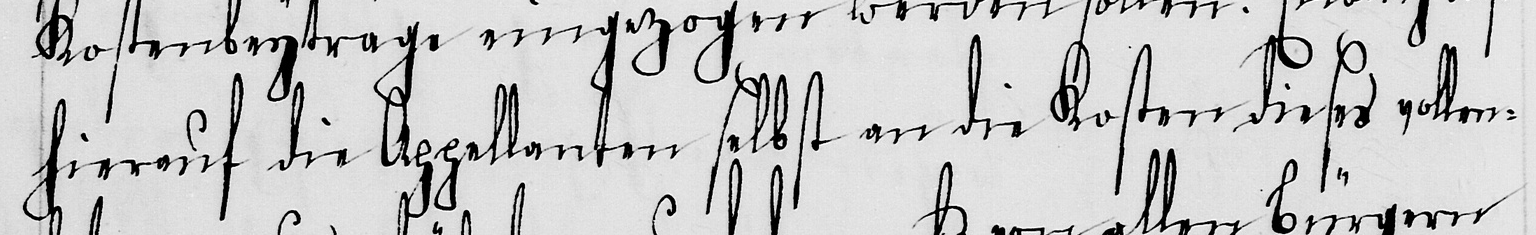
hierauf die Appellanten selbst an die Kosten
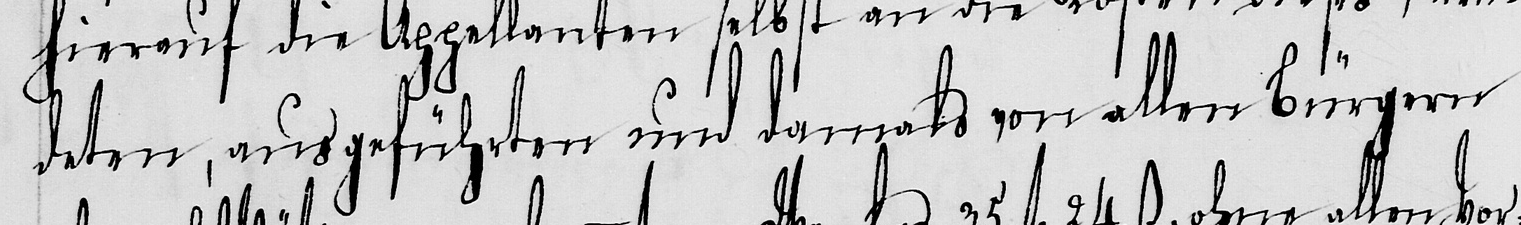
deten, ausgeführten und damals von allen Bürgern
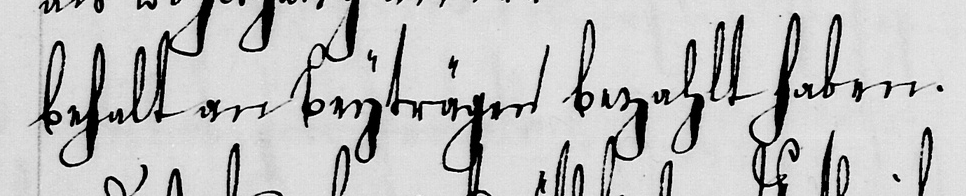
behalt an Beyträgen bezahlt haben.
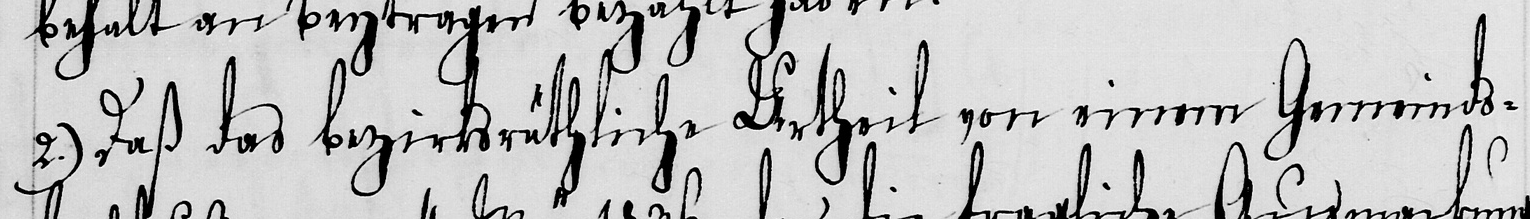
2.) Daß das bezirksräthliche Urtheil von einem Gemeinds¬
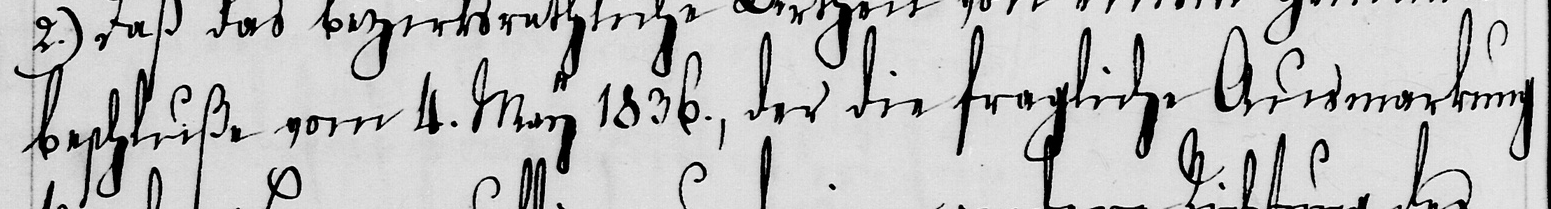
beschluße vom 4. May 1836., der die fragliche Ausmarkung
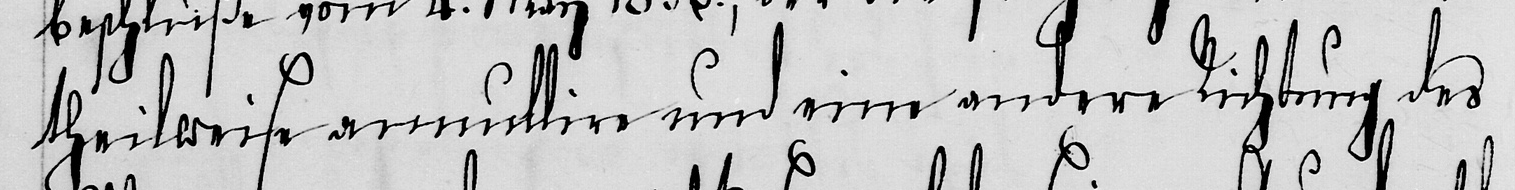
theilweise annullire und eine andere Richtung des
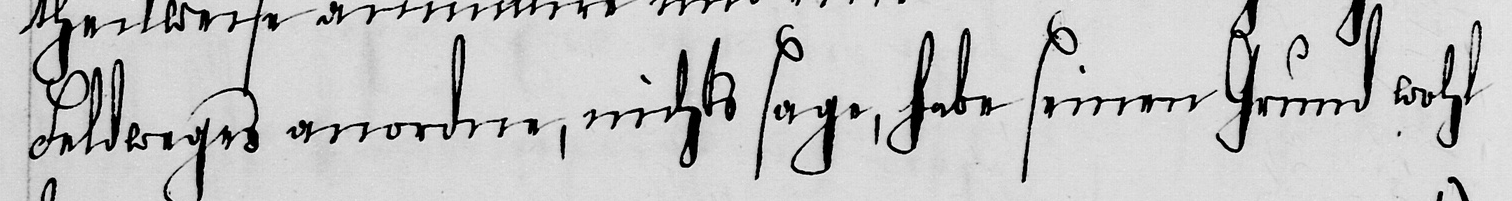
Feldweges anordne, nichts sage, habe seinen Grund wohl
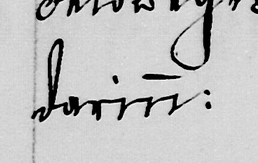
darin:
